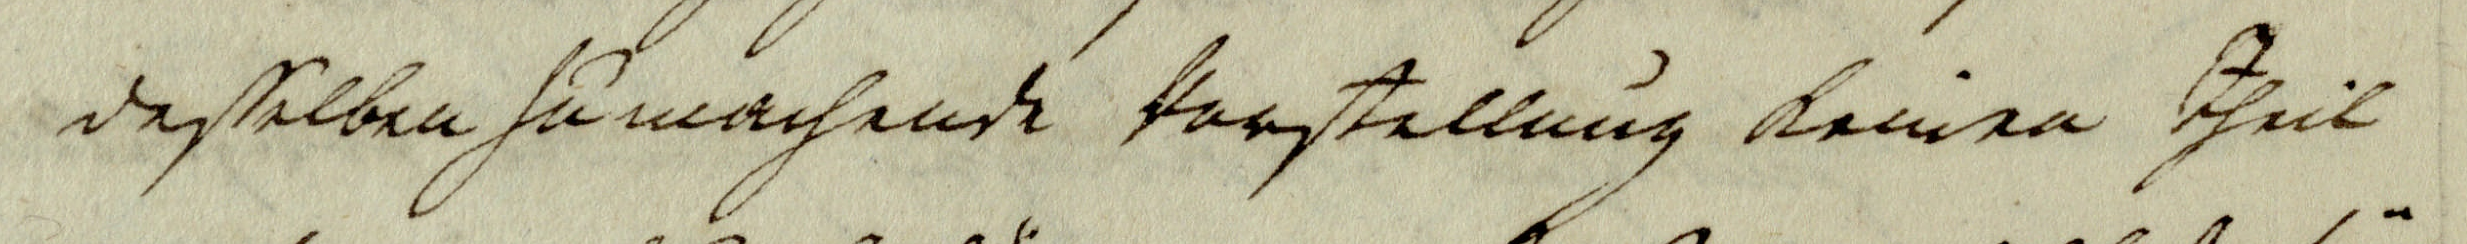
desselben zu machende Vorstellung keinen Theil
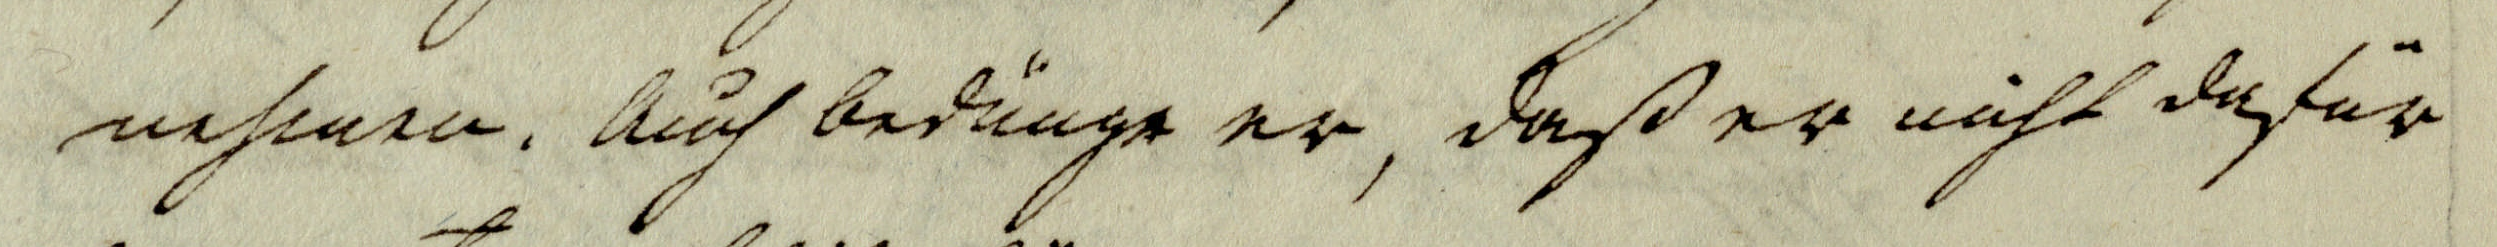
nehmen. Auch bedünge er, daß er nicht dafür
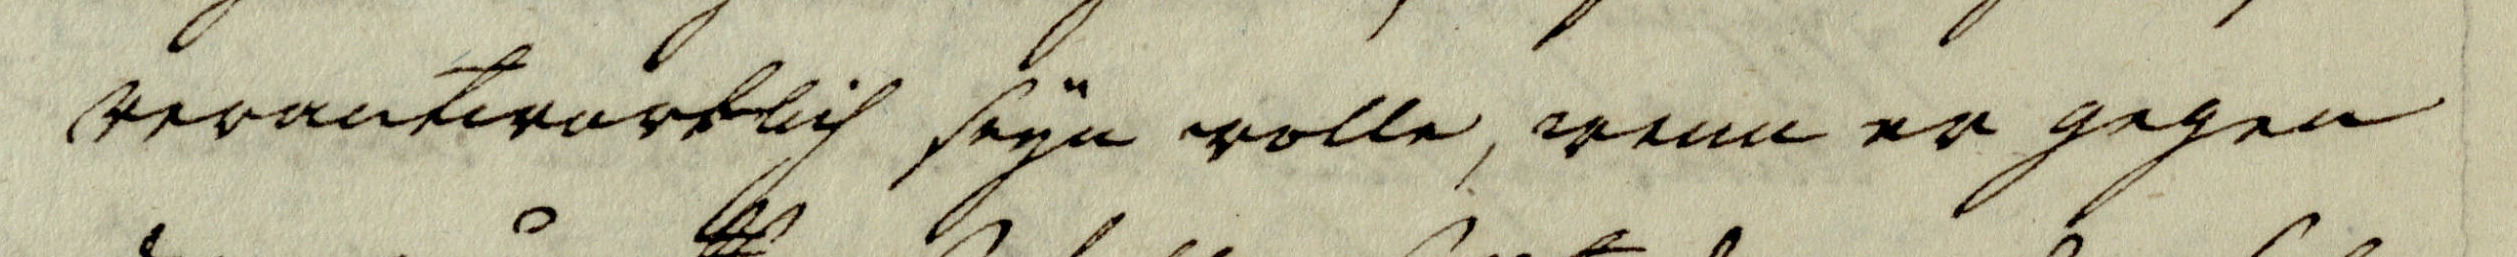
verantwortlich seÿn wolle, wenn er gegen
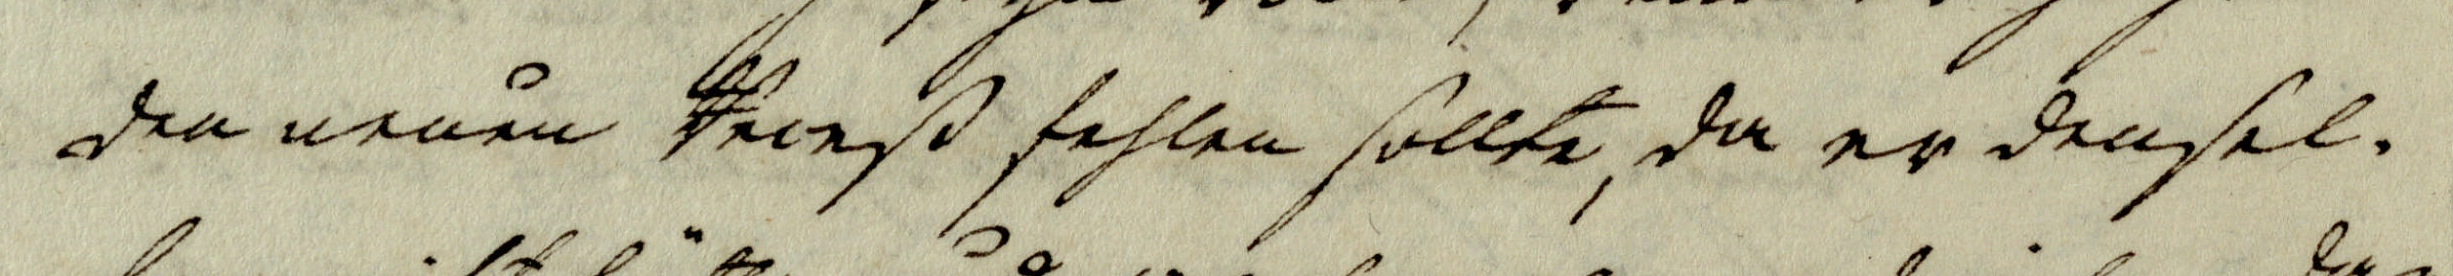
den neuen Receß fehlen sollte, da er densel¬
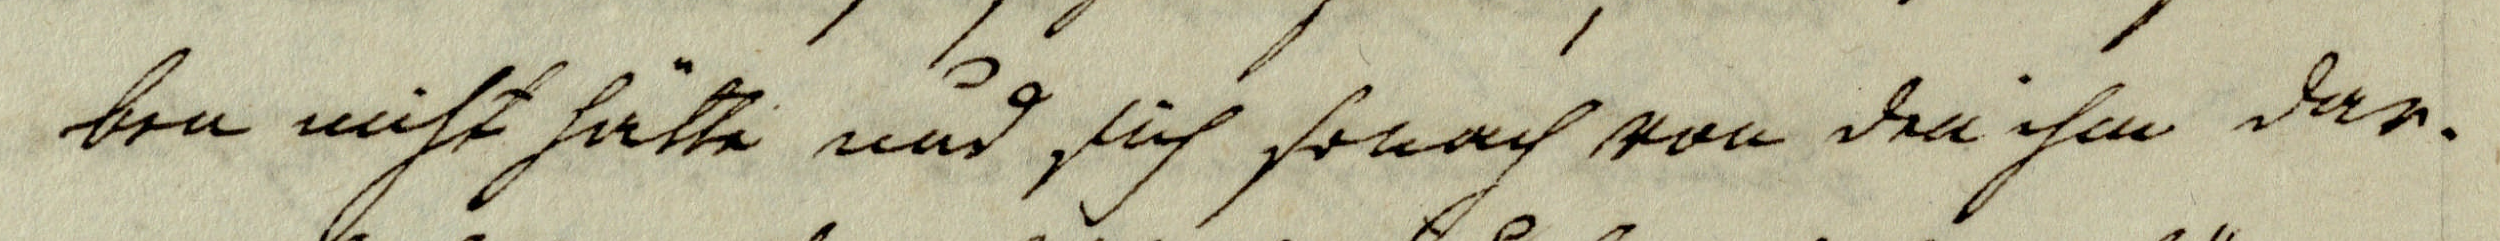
ben nicht hätte und sich sonach von den ihm dar¬
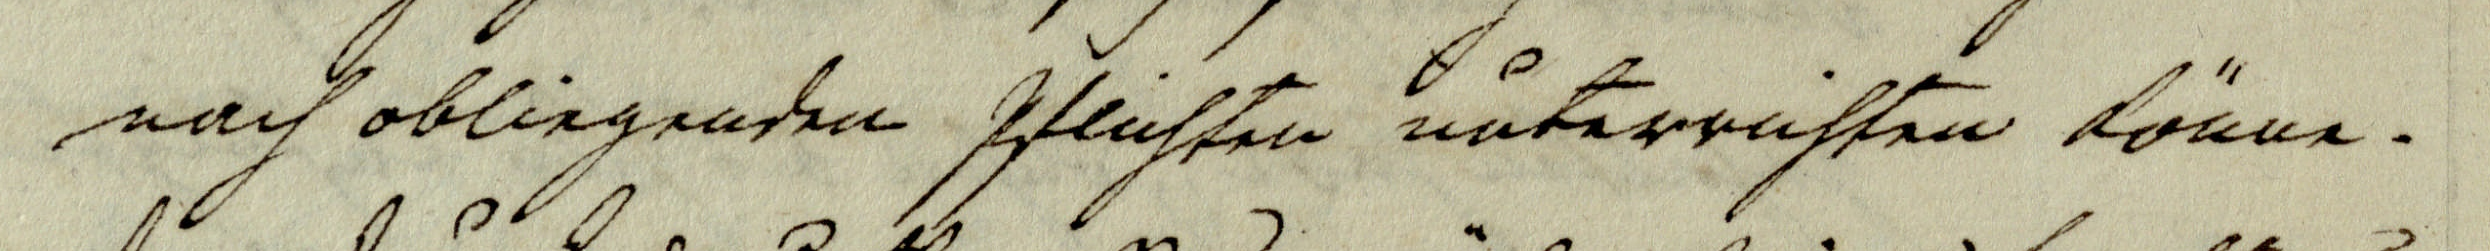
nach obliegenden Pflichten unterrichten könne.
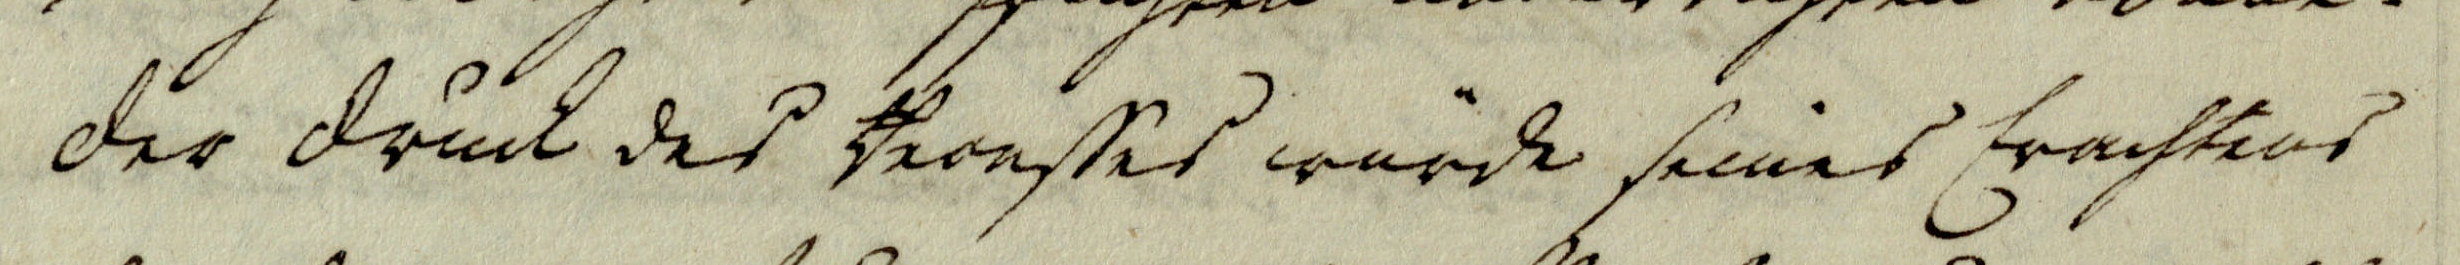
Der Druck des Recesses würde seines Erachtens
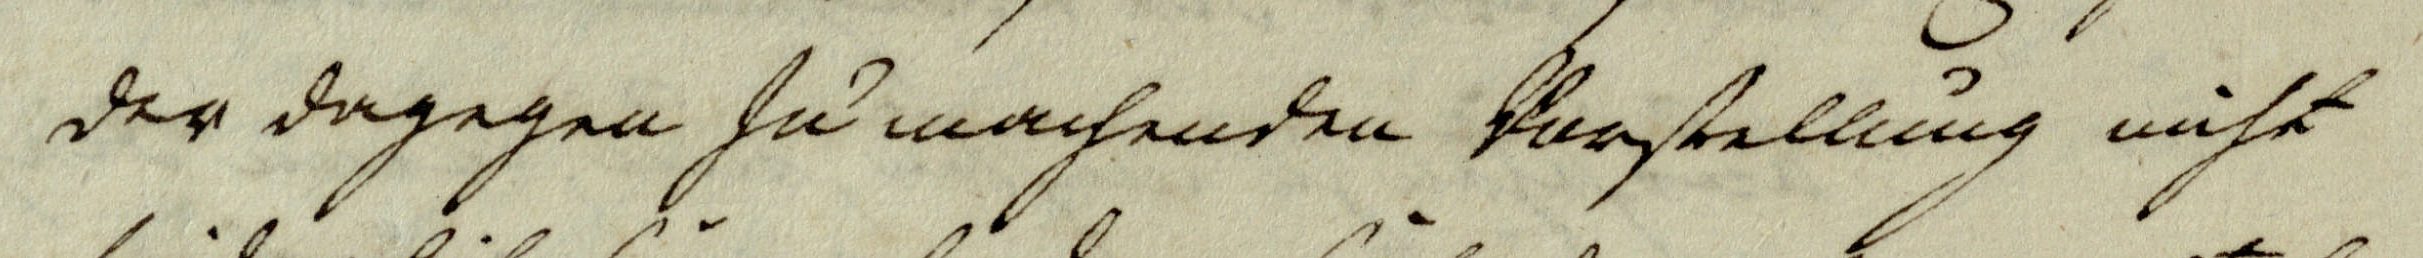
der dagegen zu machenden Vorstellung nicht
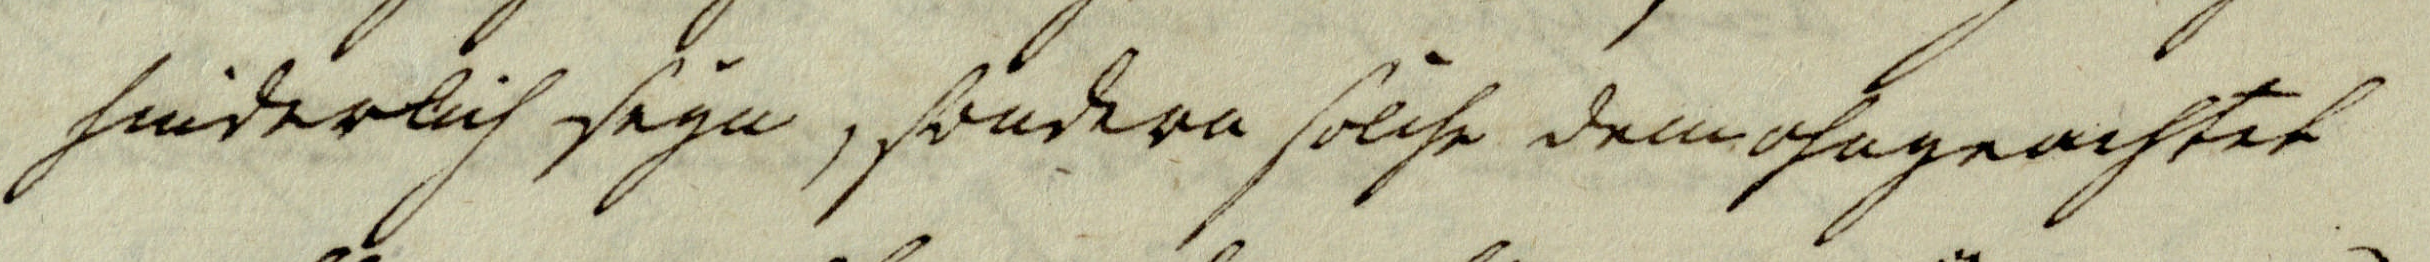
hinderlich seÿn sondern solche demohngeachtet
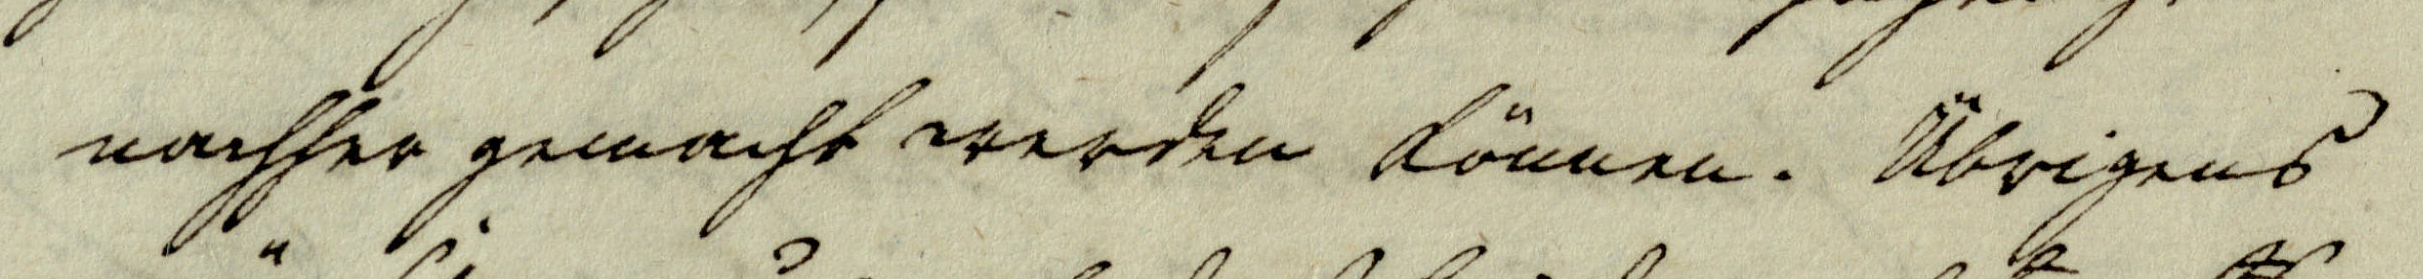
nachher gemacht werden können. Übrigens
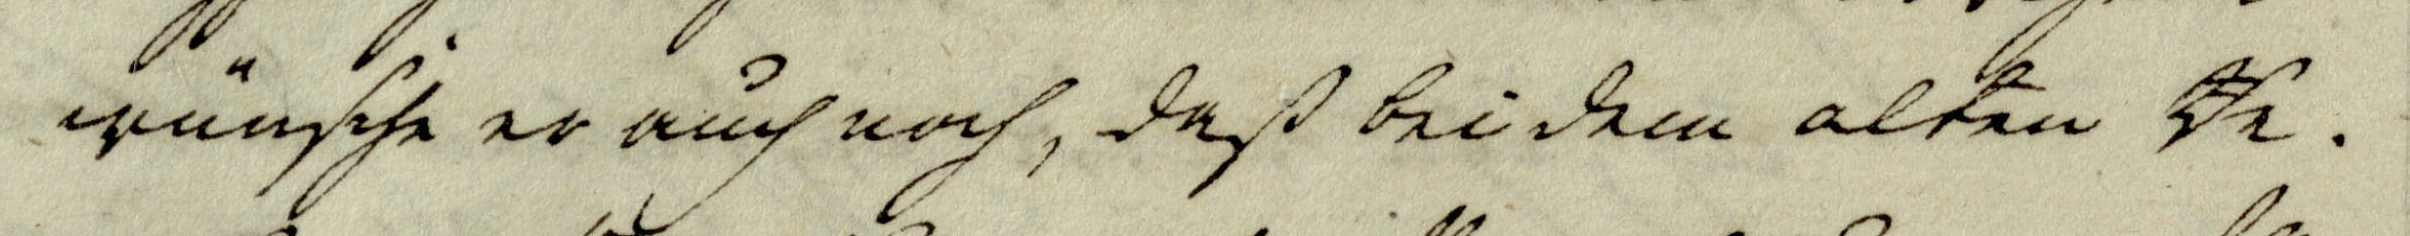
wünsche er auch noch, daß bei dem alten Re¬
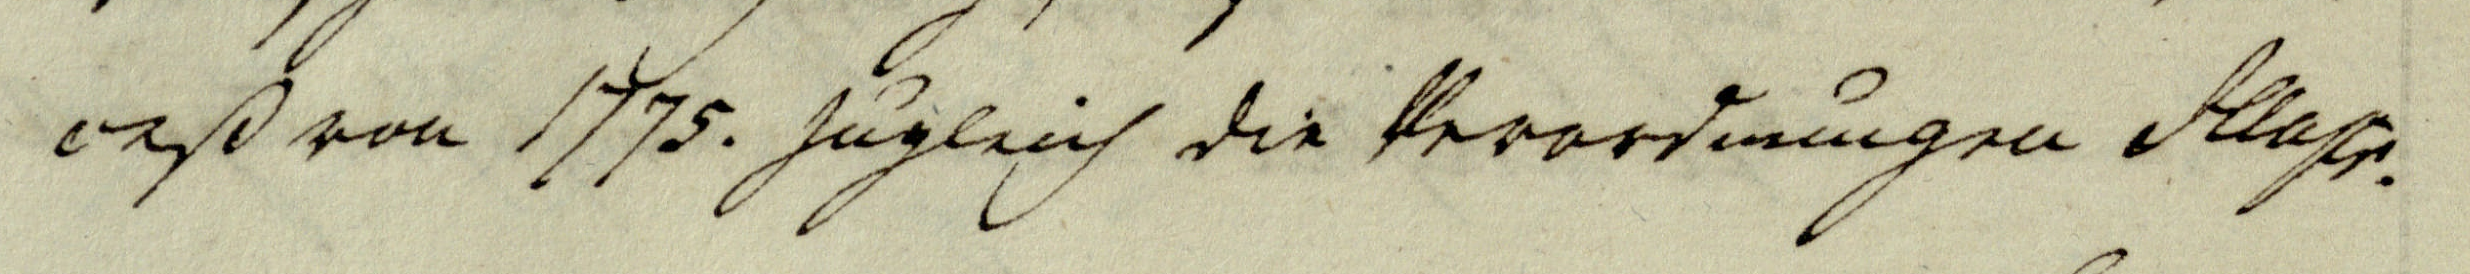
ceß von 1775. zugleich die Verordnungen Illustr.
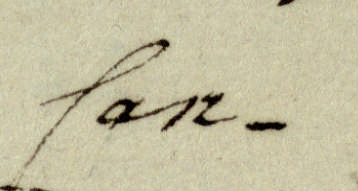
Can¬
